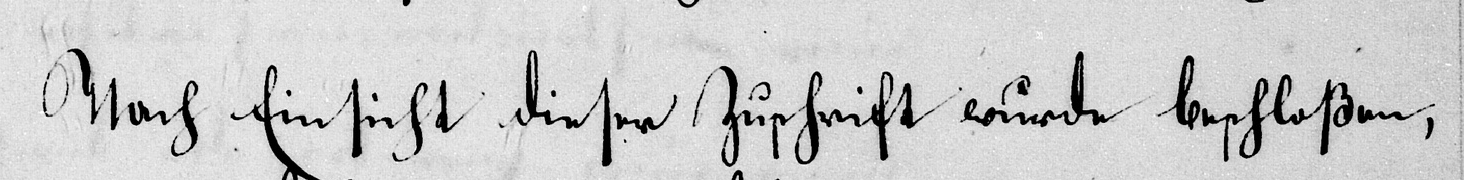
Nach Einsicht dieser Zuschrift wurde beschloßen,
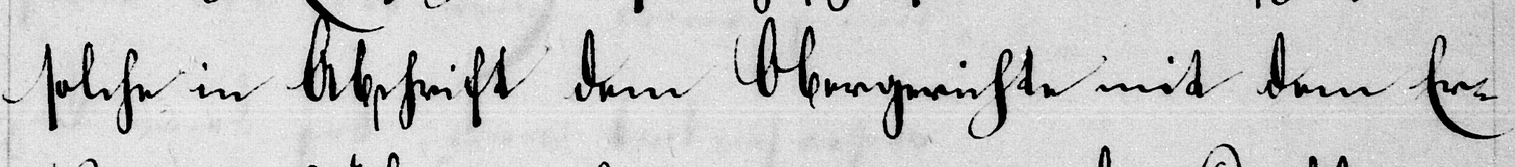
solche in Abschrift dem Obergerichte mit dem Er¬
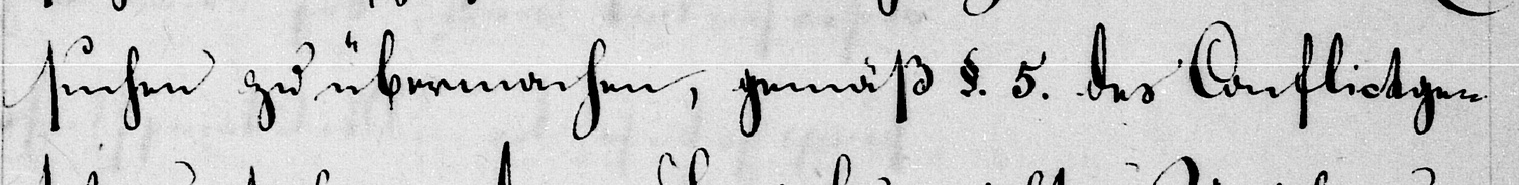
suchen zu übermachen, gemäß §. 5. des Conflictge¬
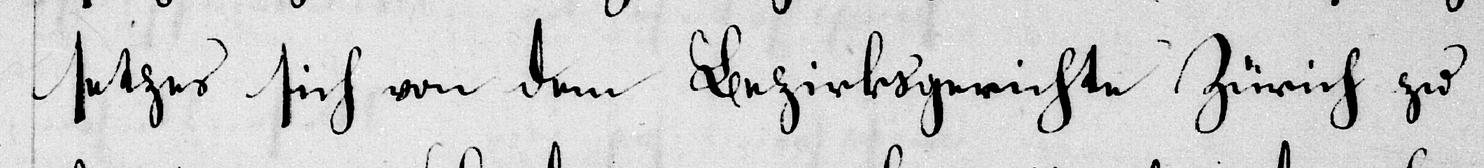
setzes sich von dem Bezirksgerichte Zürich zu
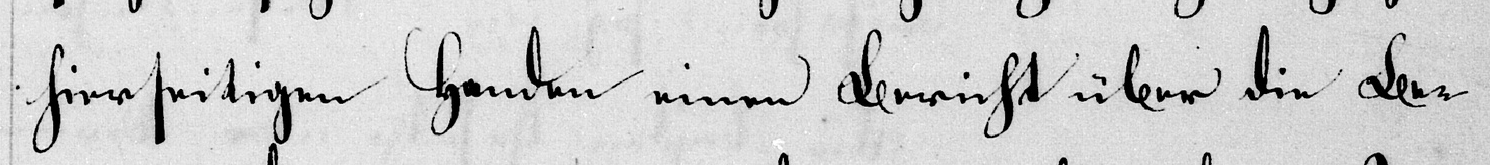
hierseitigen Handen einen Bericht über die Be¬
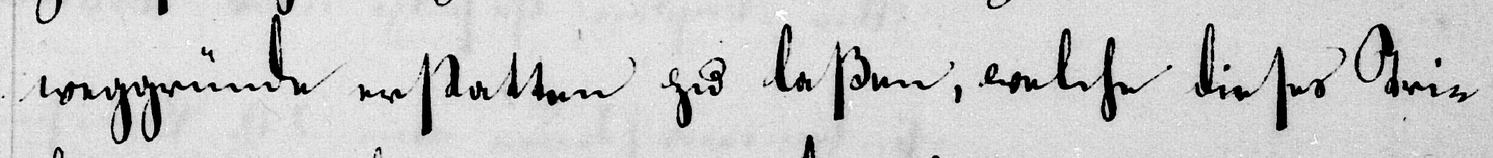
weggründe erstatten zu laßen, welche dieses Tri¬
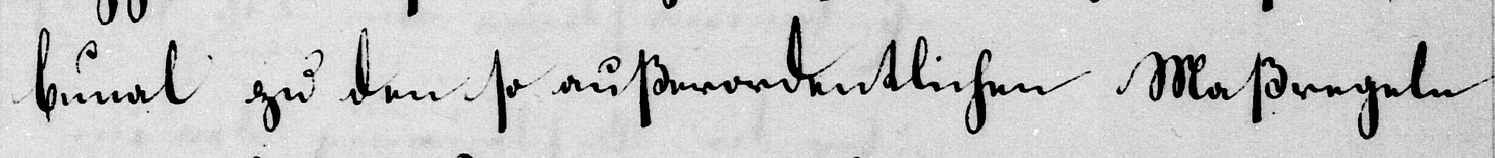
bunal zu den so außerordentlichen Maßregeln
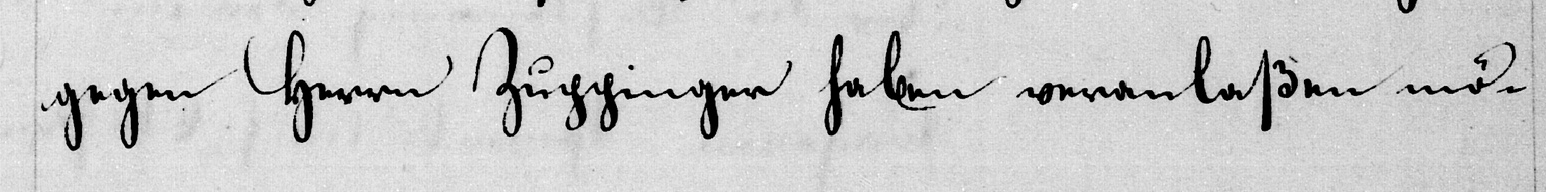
gegen Herrn Zuppinger haben veranlaßen mö¬
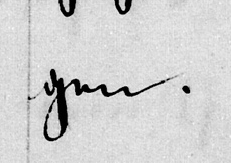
gen.
